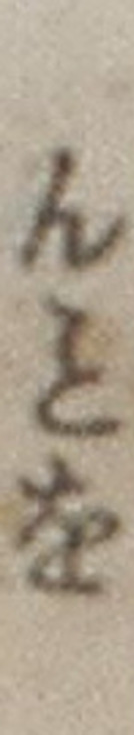んことを
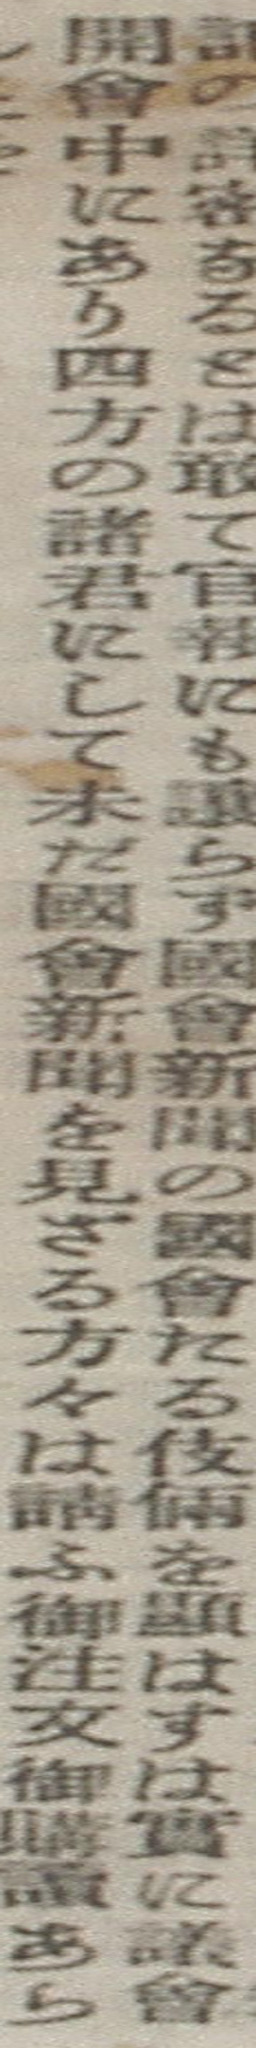開催中にあり四方の諸君にして未だ国会新聞を見ざる方々は請ふ御注文御購読あら
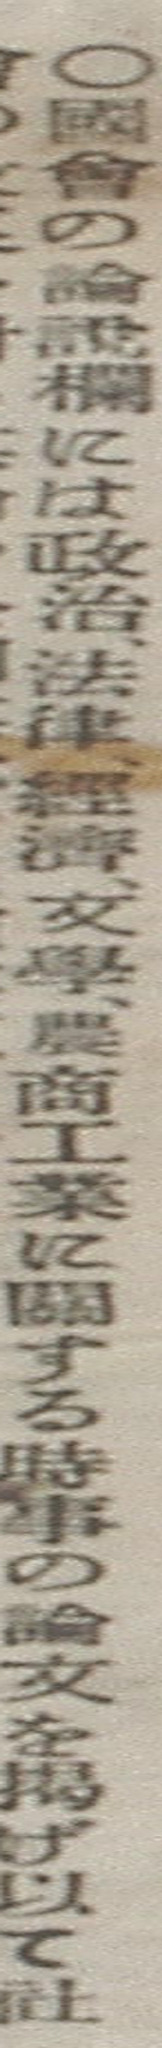〇国会の論説欄には政治、法律、経済、文学、農商工業に関する時事の論文を掲げ以て社
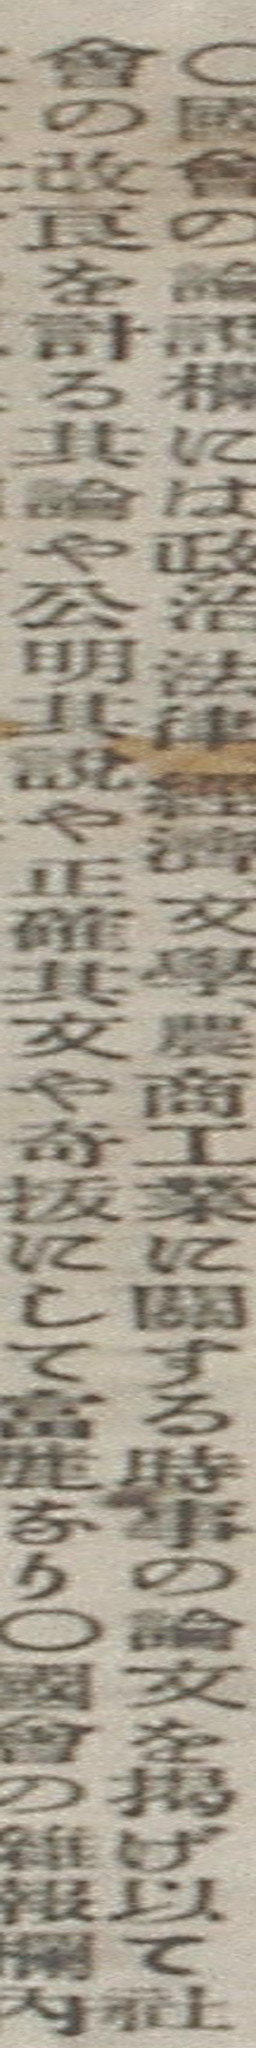会の改良を計る其論や公明其説や正確其文や奇抜にして富麓なり〇国会の雑報欄内
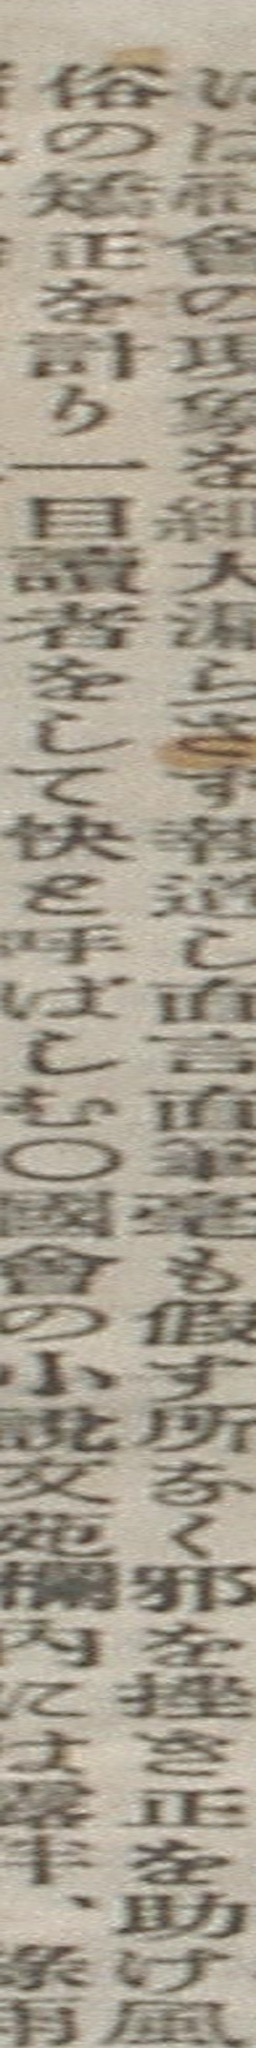俗の矯正を計り一目読者をして快と呼ばしむ〇国会の小説文苑欄内には露伴、緑雨
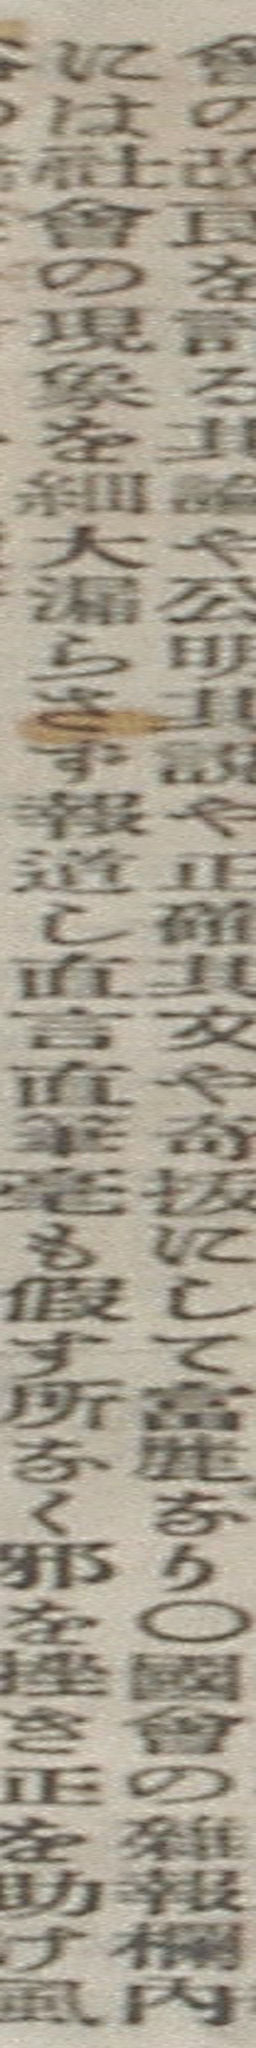には社会の現象を細大漏らさず報道し直言直筆毫も仮す所なく邪を挫き正を助け風
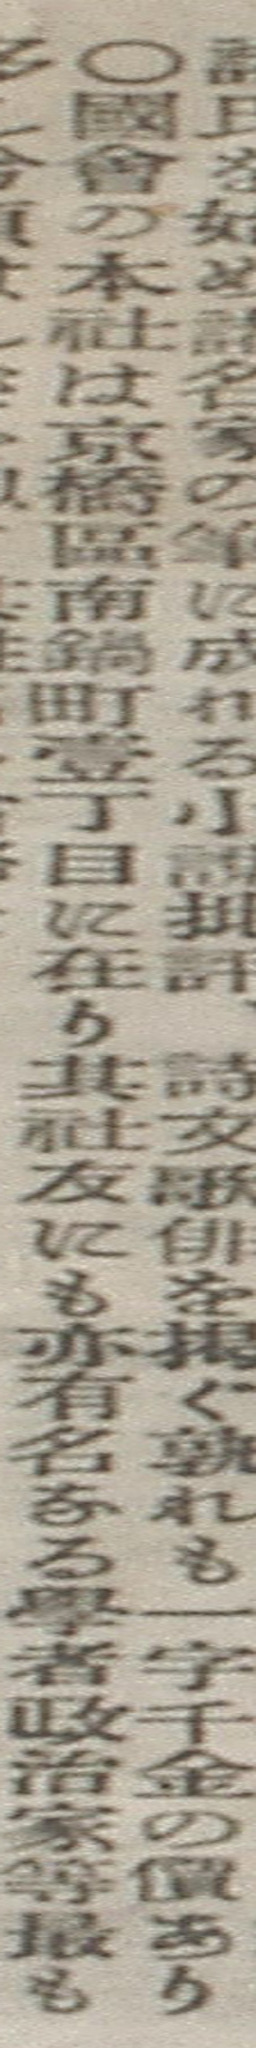〇国会の本社は京橋区南鍋町一丁目に在り其社友にも亦有名なる学者政治家等最も
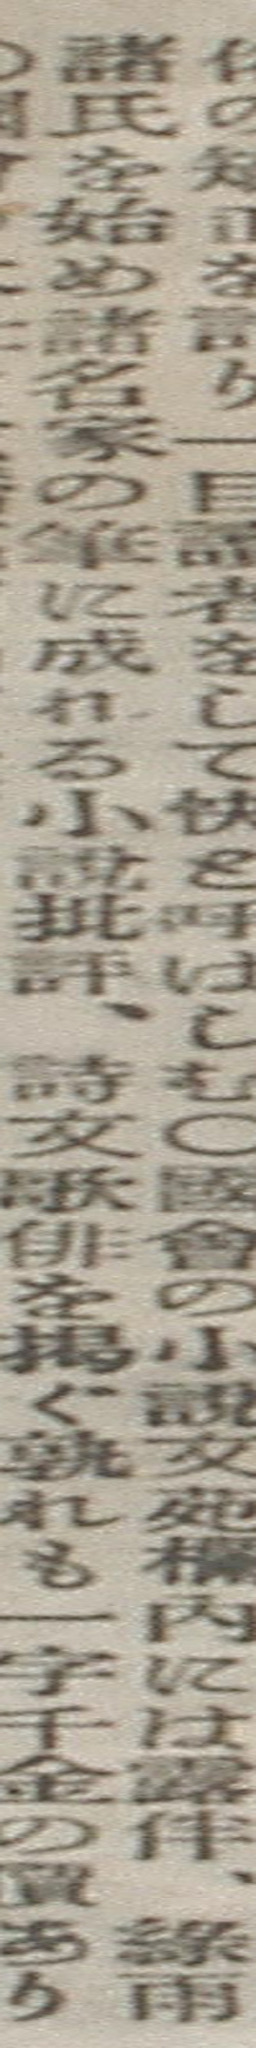諸氏を始め諸名家の筆に成れる小説批評、詩文歌俳を掲ぐ孰れも一字千金の価あり
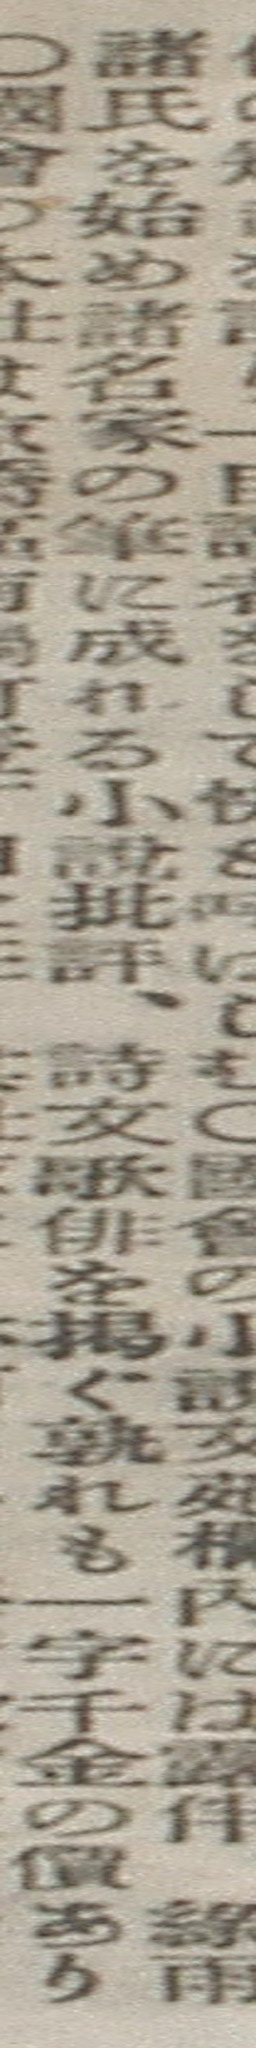諸氏を始め諸名家の筆に成れる小説批評、詩文歌俳を掲ぐ孰れも一字千金の価あり
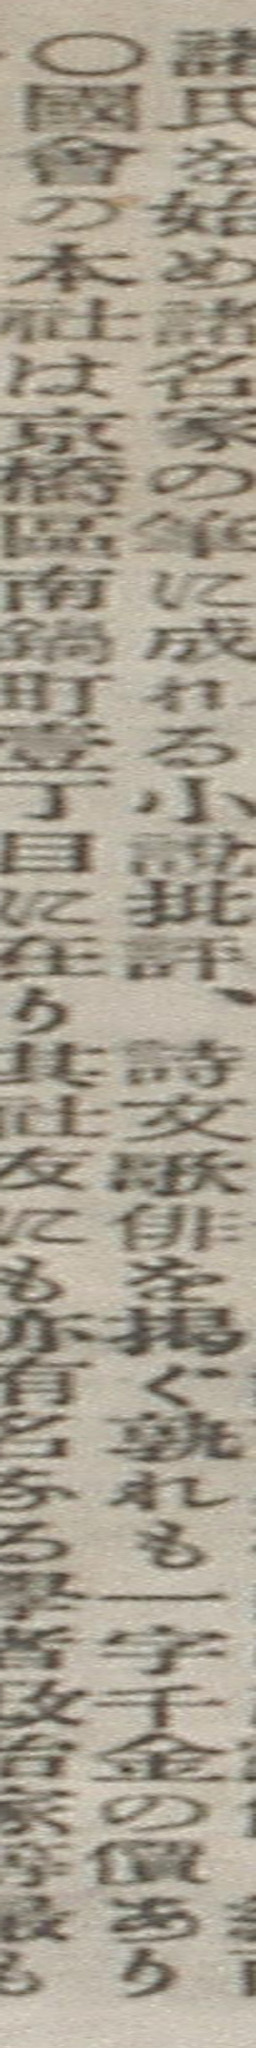〇国会の本社は京橋区南鍋町一丁目に在り其社友にも亦有名なる学者政治家等最も
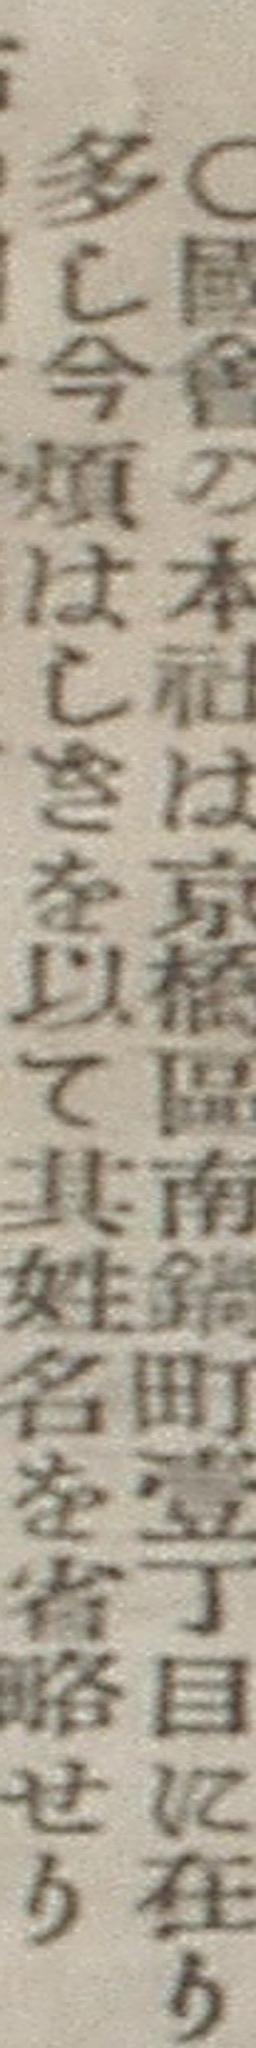多し今煩はしきを以て其姓名を省略せり
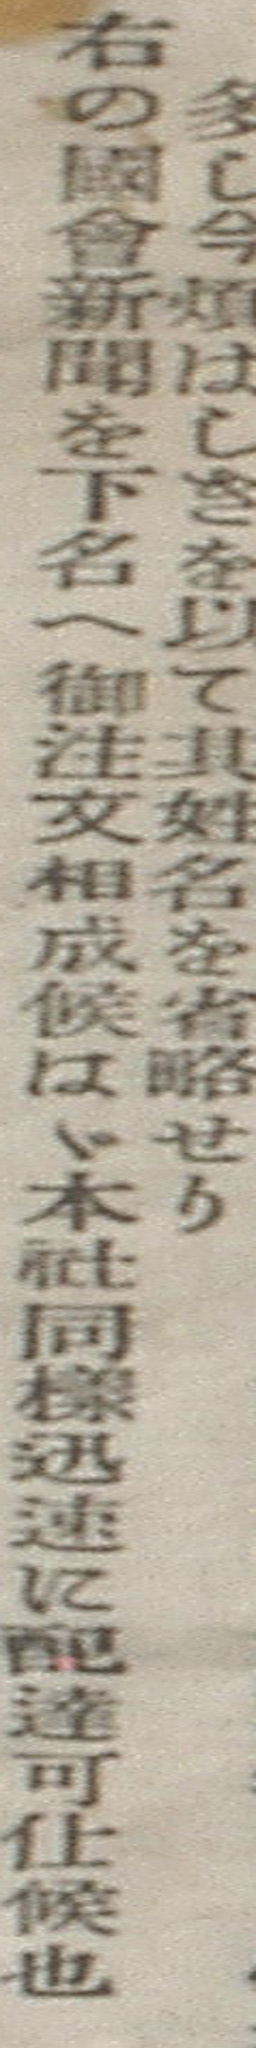右の国会新聞を下名へ御注文相成候はゞ本社同様迅速に配達可仕候也
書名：愛知岐阜福井三県　大地震見聞録（内題）
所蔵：東京大学地震研究所図書室 Earthquake Research Institute Library, The University of Tokyo, JAPAN
